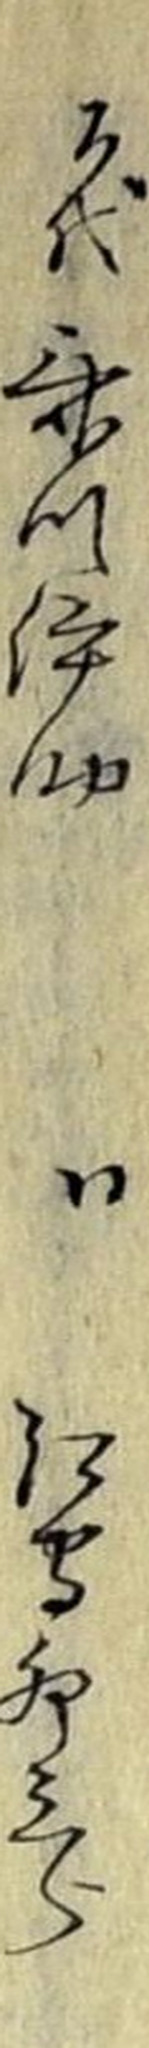斉川伊助同江守卯三郎
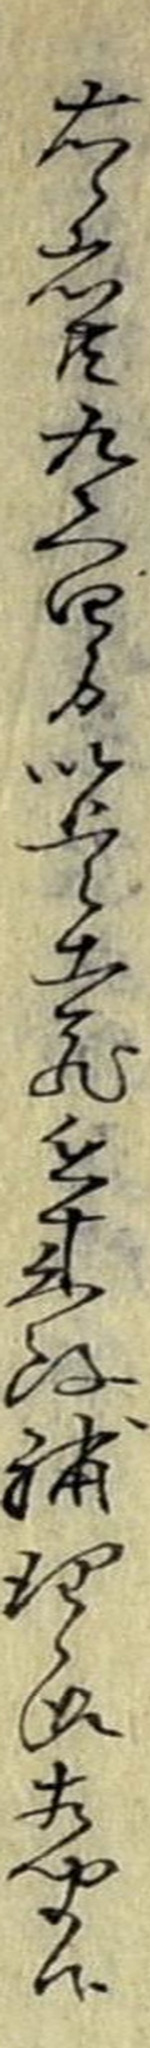右之者共九尺四方以上之土蔵近来致補理候趣相聞候
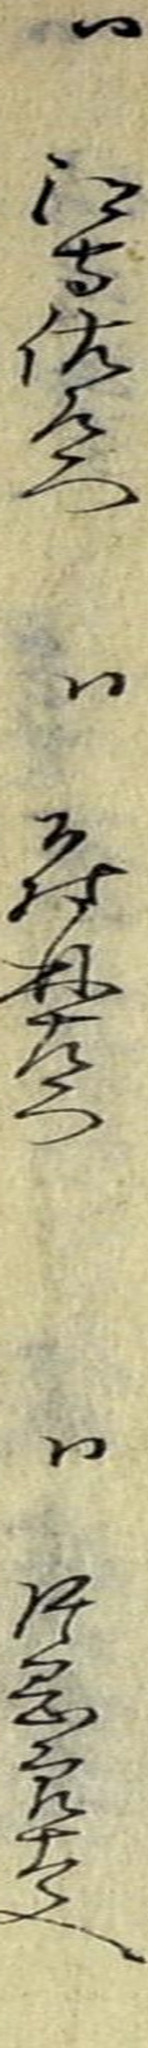同江守佐左衛門同下村林左衛門同片岡官太夫
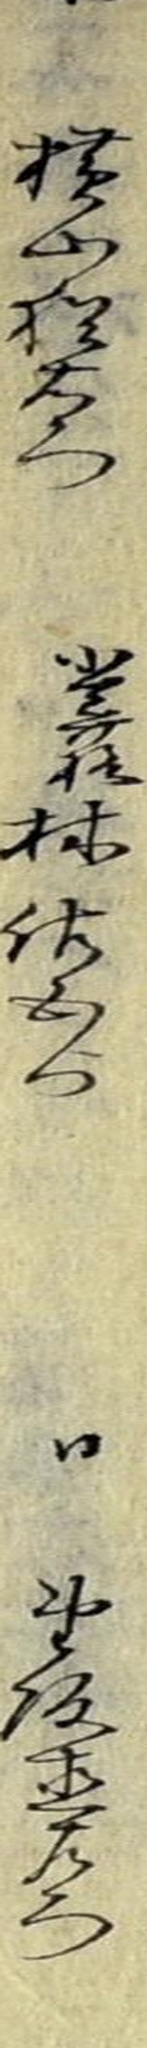同横山猪右衛門林佐五右衛門同野坂直左衛門
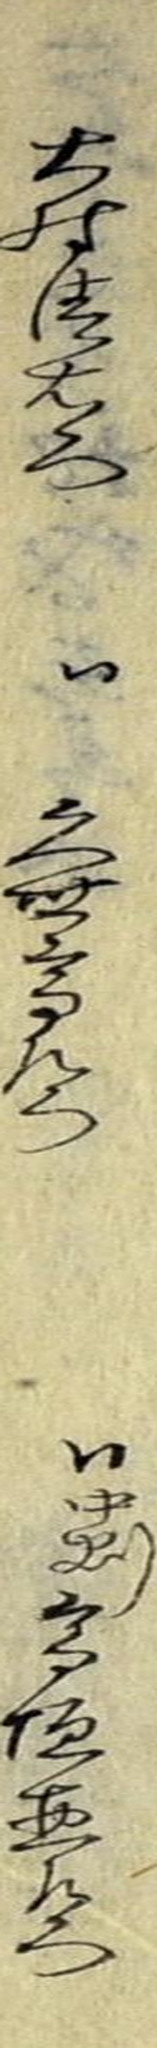同大村清右衛門同久世高左衛門高垣惣左衛門
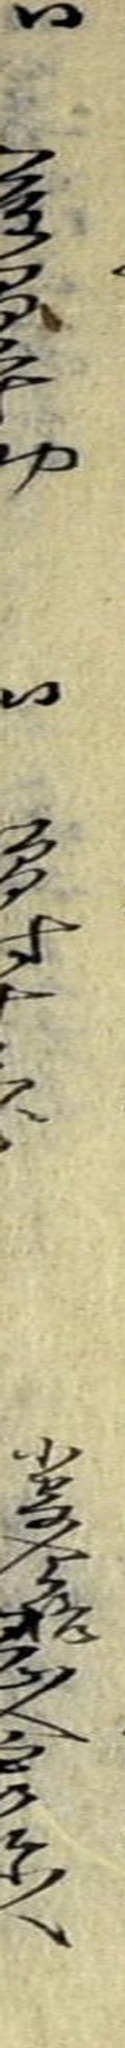同藤間平助同増村十三郎甚倉弥八
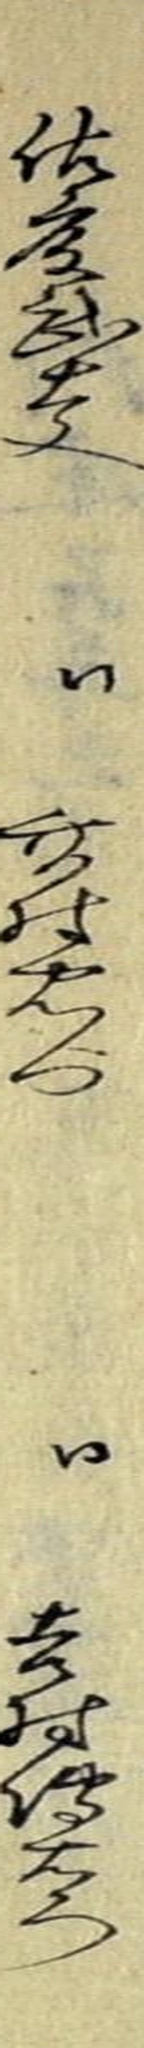同佐藤武太夫同竹村忠右衛門同吉村伝右衛門
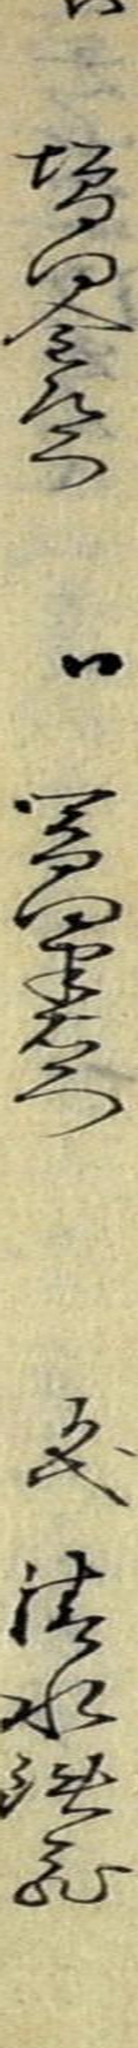同増田金左衛門同富田半右衛門清水鉄蔵
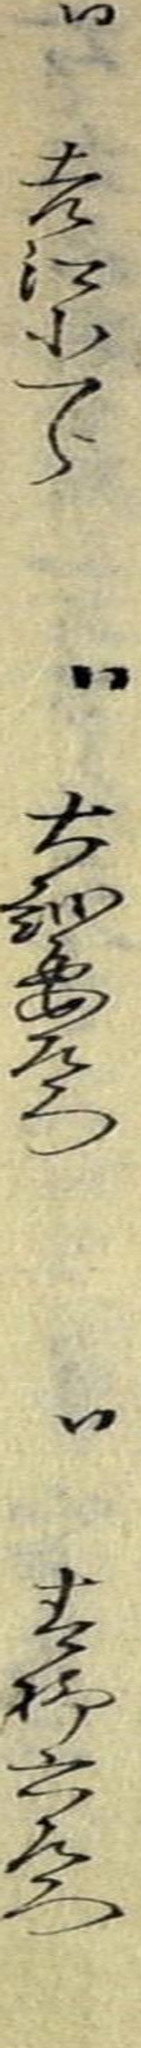同吉江小一郎同大細番左衛門同青柳六左衛門
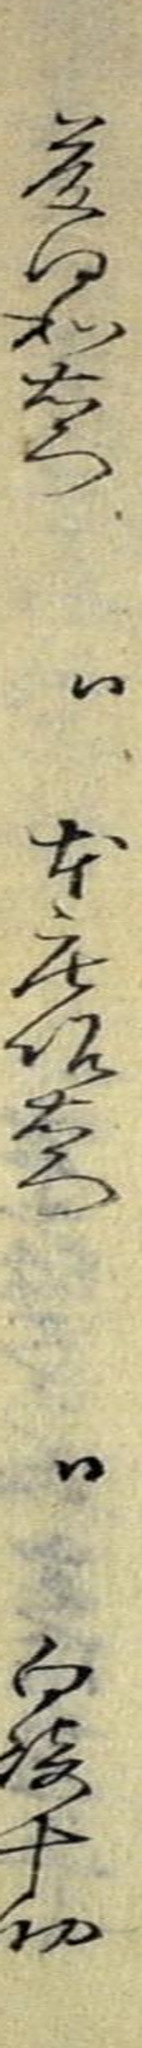同藤田利右衛門同本庄作右衛門同白崎十助
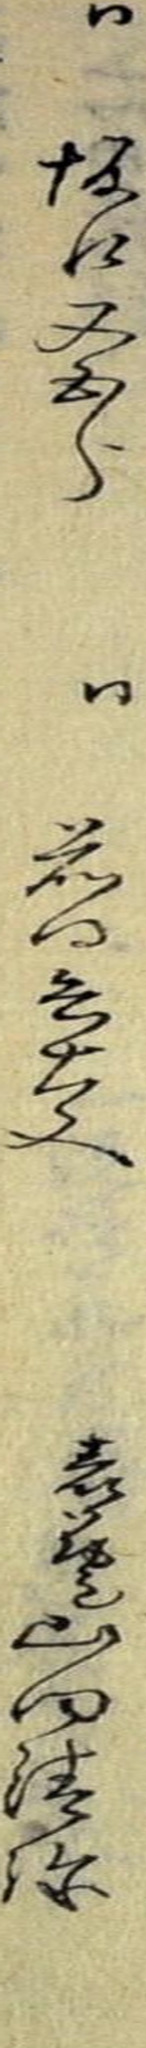同坂口又五郎同前田兵太夫山田清弥
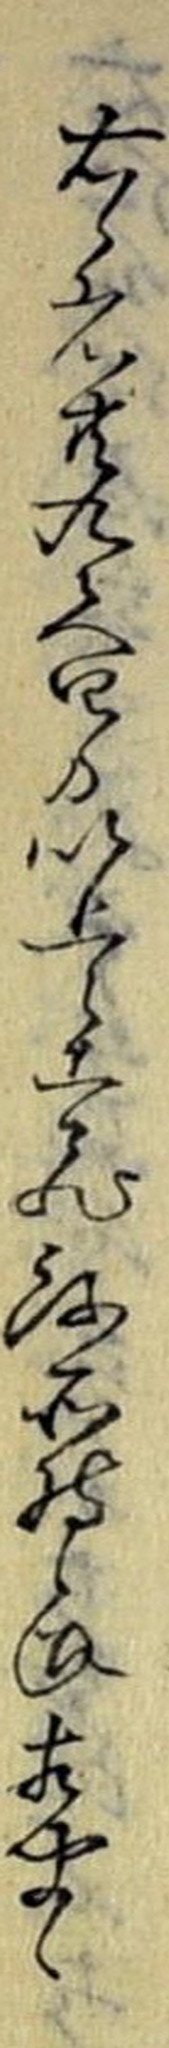右之者共九尺四方之土蔵致所持候趣相聞候
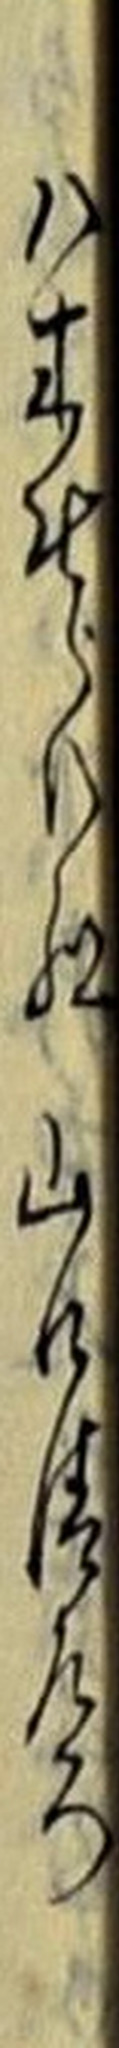八木次郎八組山口清左衛門
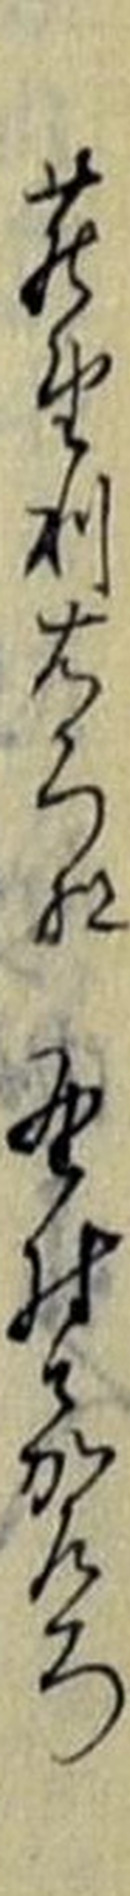荻野利右衛門組野村嘉左衛門
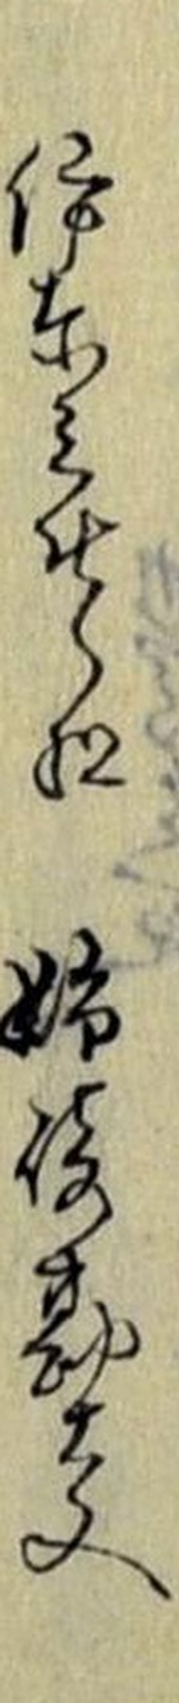伊東三次郎組姉崎勘太夫
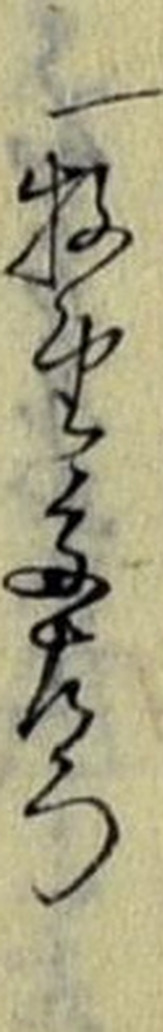牧野多左衛門
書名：命令之部 六
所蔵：福井県文書館 Fukui Prefectural Archives
